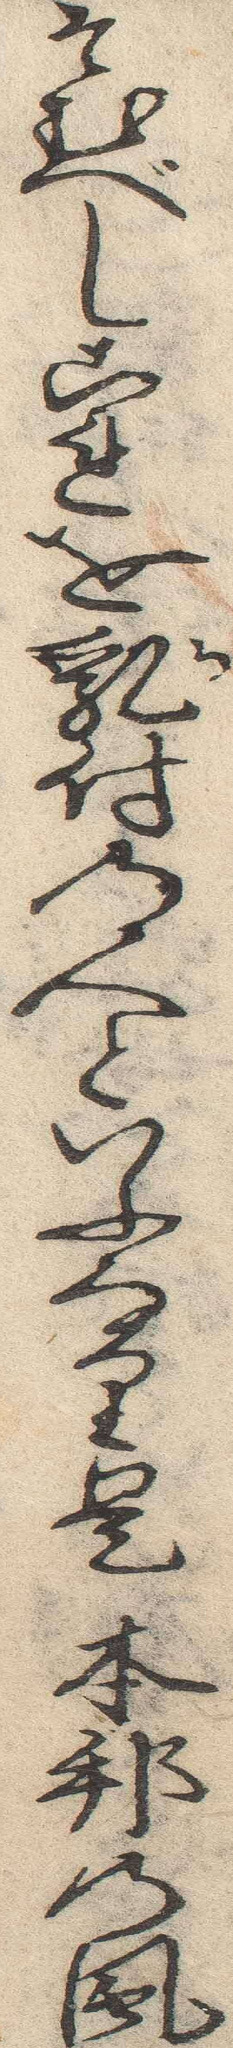そむべしこれを乳付きの人といふなり是本邦の風
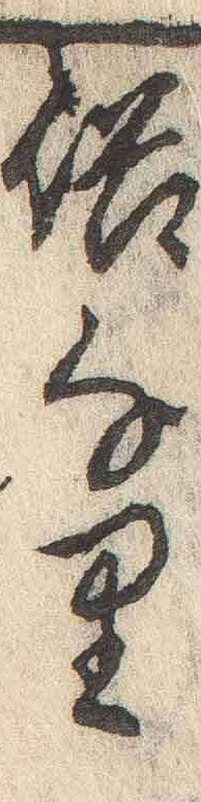俗なり
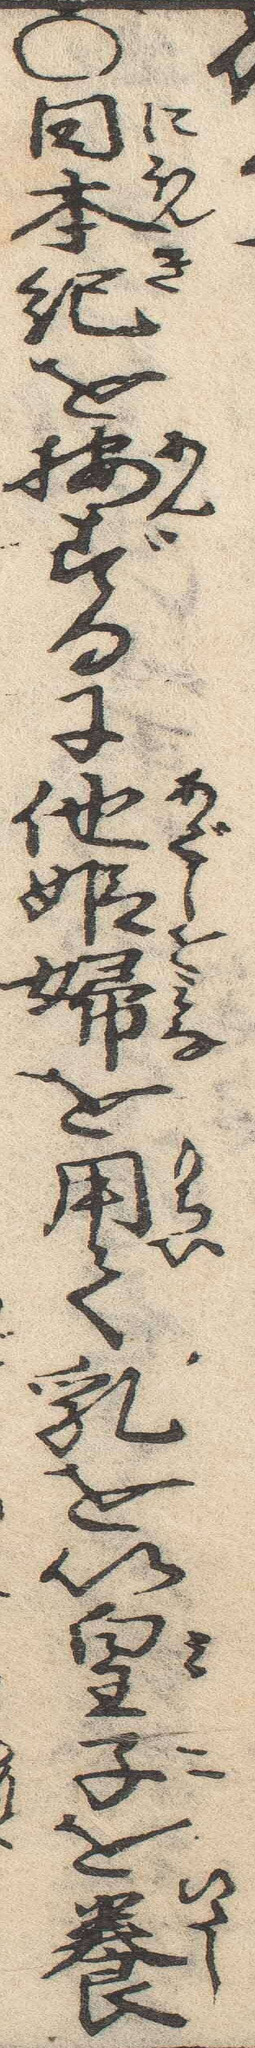◯日本紀を按ずるに他姫婦を用て乳を以皇子を養
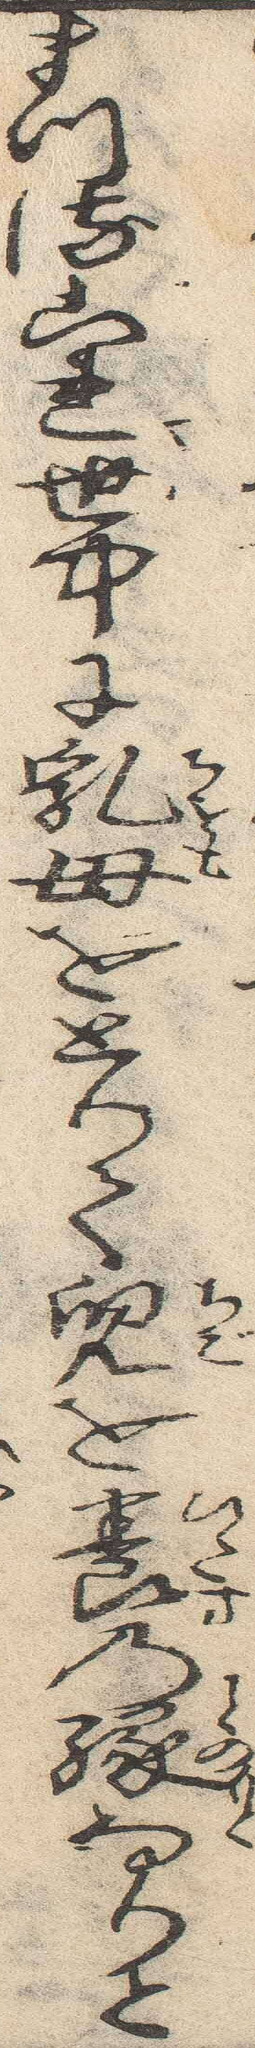まつるこれ世中に乳母をとりて児を養の縁なりと
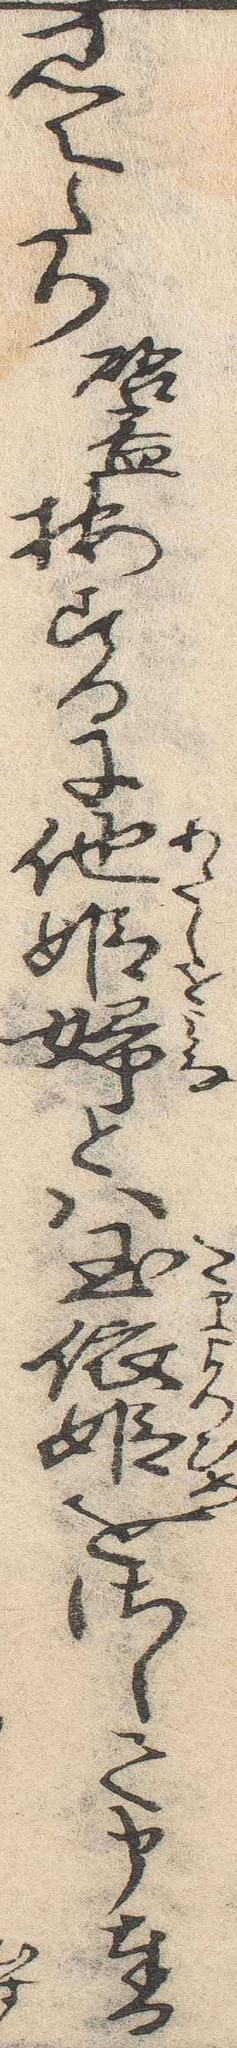見えたり啓益按するに他姫婦とは玉依姫をさして申奉る
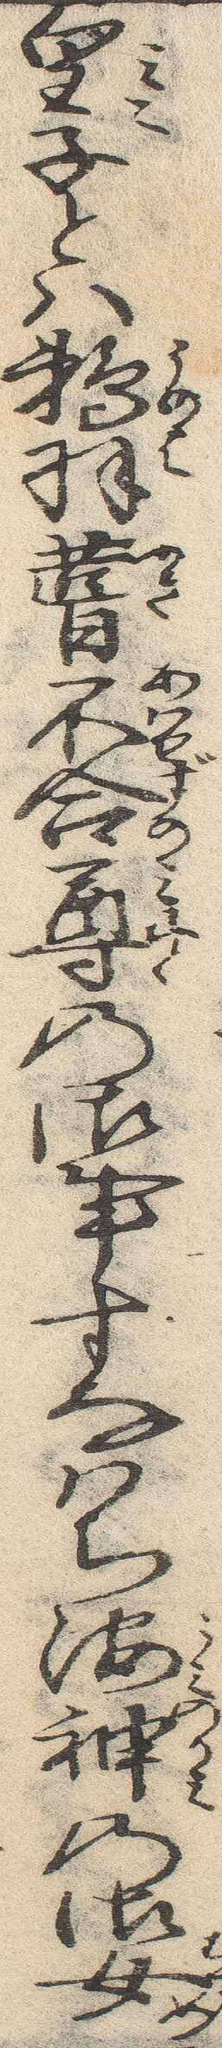皇子とは鵜羽葺不合尊の御事すなはち海神の御女
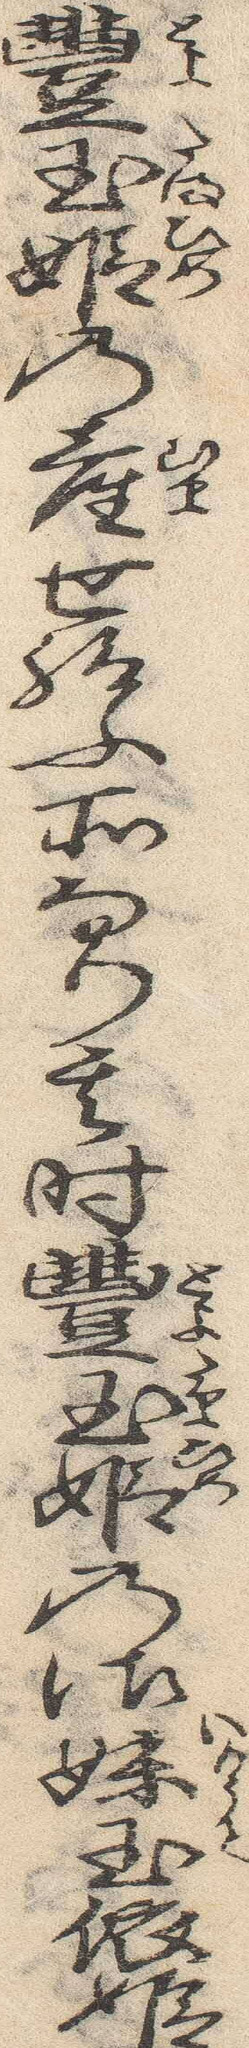豐玉姫の産せ給う所なり其時豐玉姫の御妹玉依姫
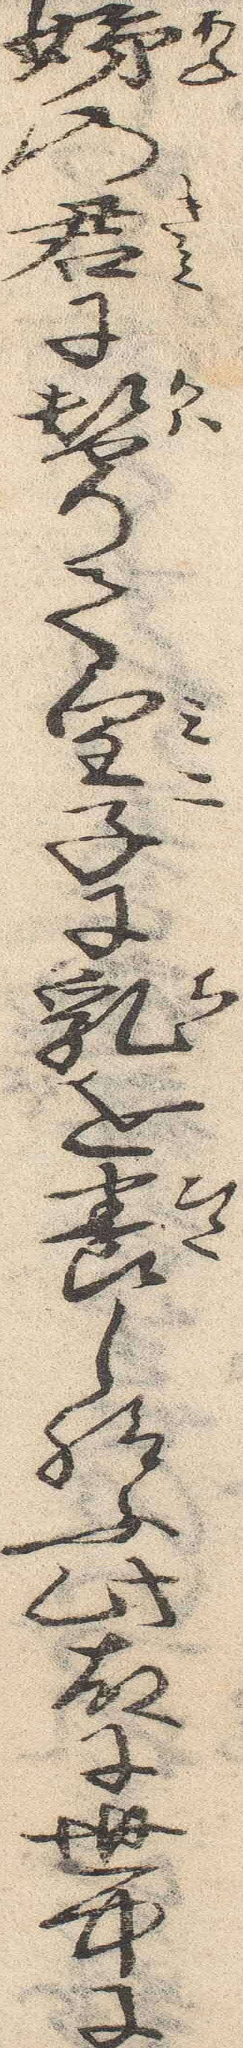姊の君に替りて皇子に乳を養し給ふ此故に世中に
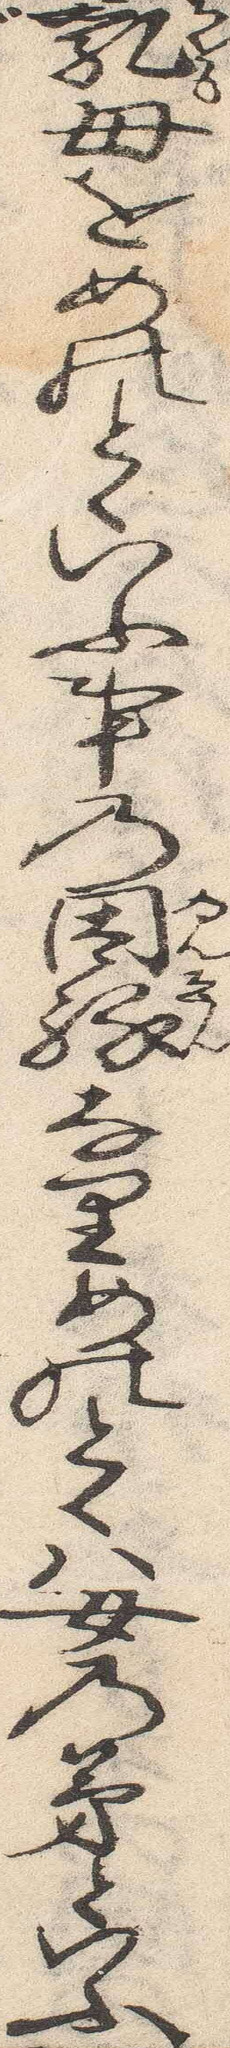乳母をめのとゝいふ事の因縁なりめのとゝは母の弟といふ
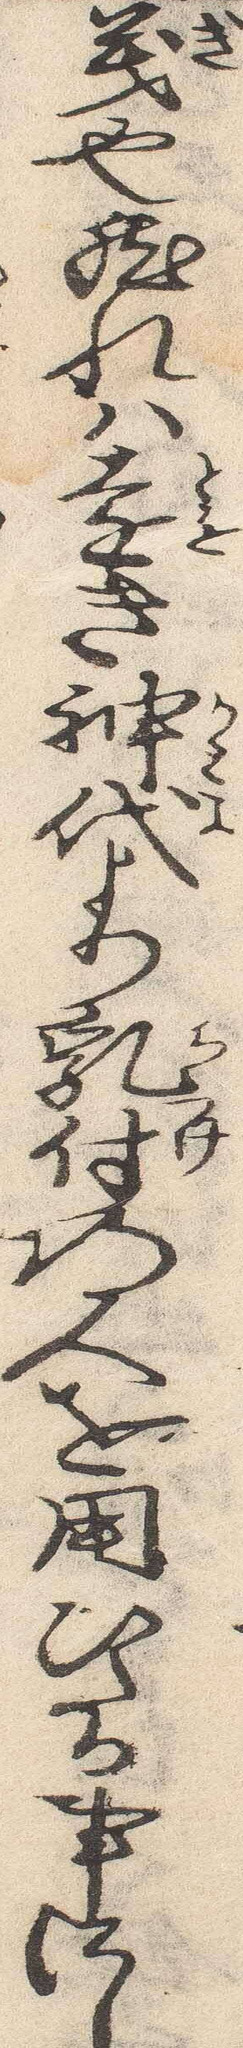義也然れは遠き神代より乳付の人を用ひたる事にし
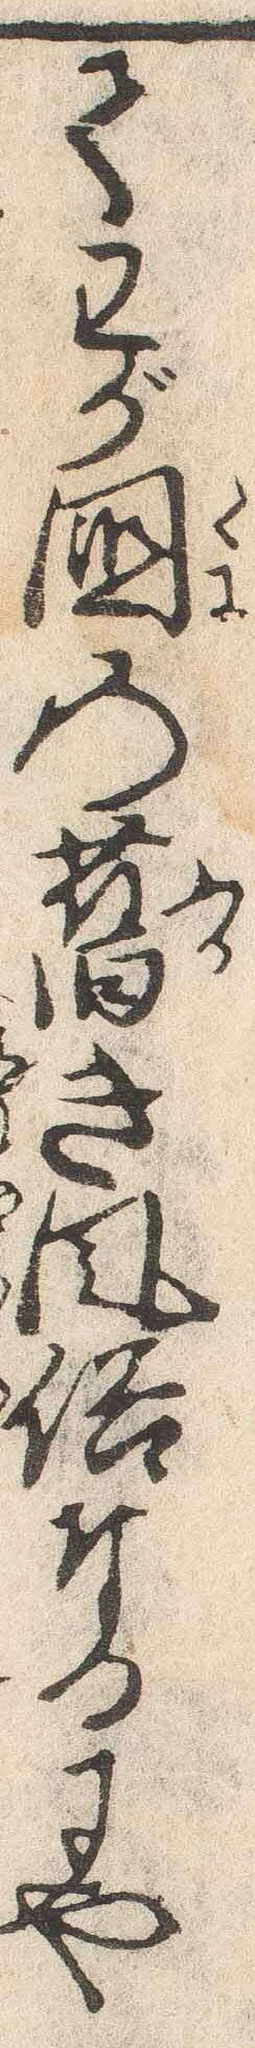てわが國の旧き風俗なるにや
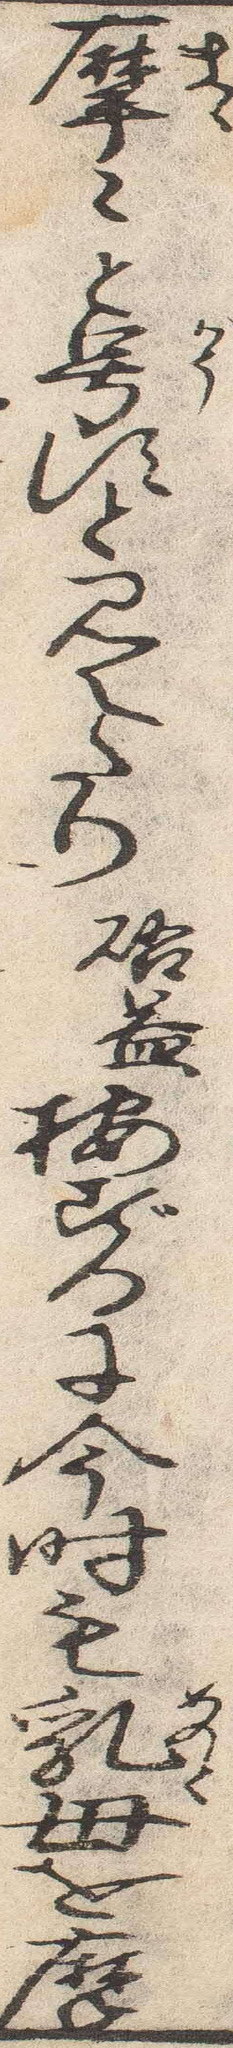摩〻と号すと見えたり啓益按ずるに今時も乳母を摩
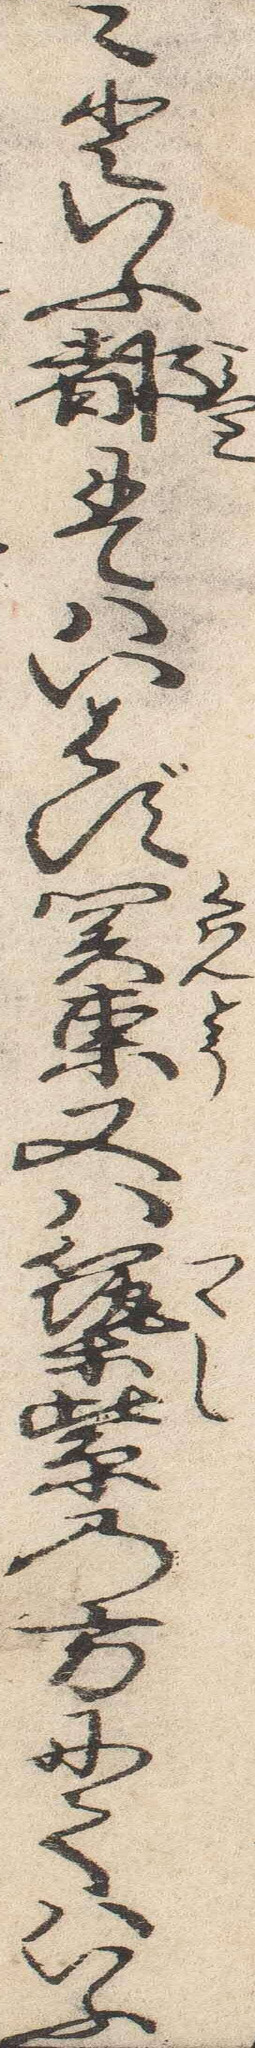々といふ都にてはいはず関東又は築紫の方にてはいふ
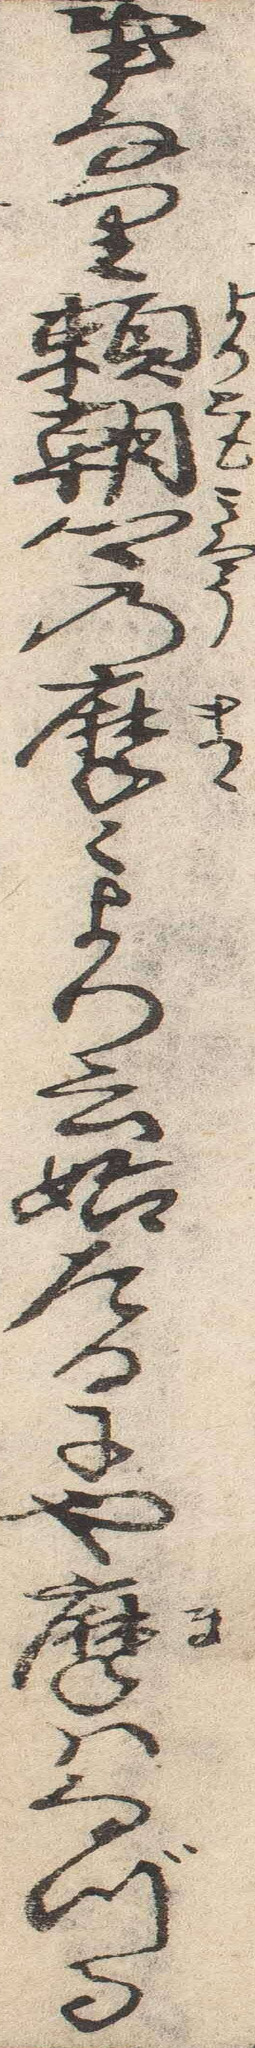事なり頼朝卿の摩〻より云始たるにや摩はなづる
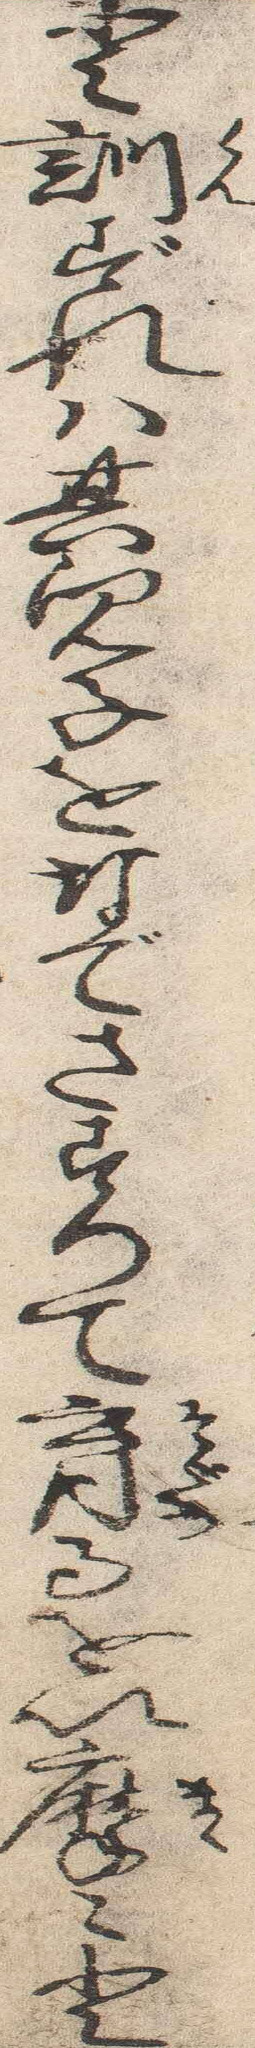と訓ずれは其児子をなでさすりて育るを以摩〻と
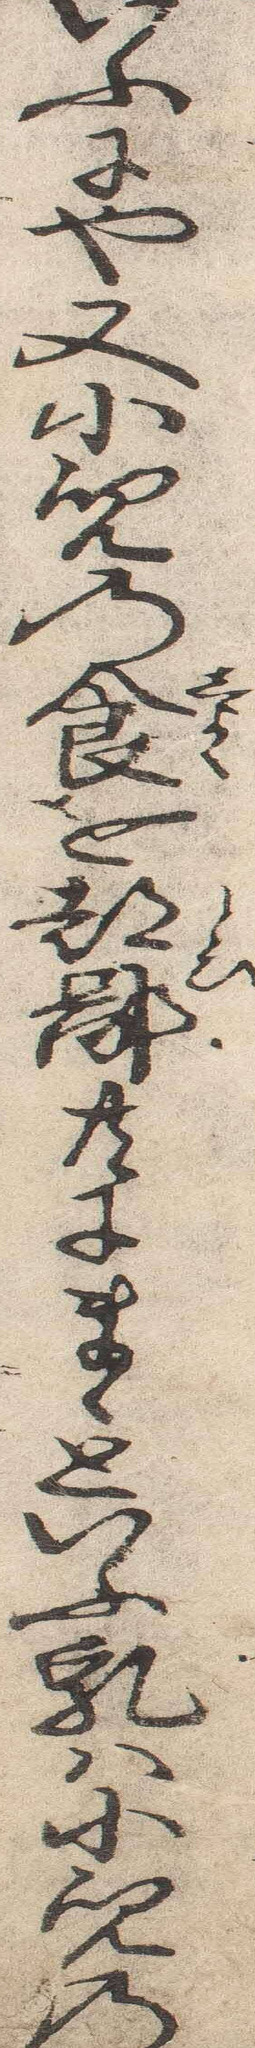いふにや又小児の食を都鄙共にまゝといふ乳は小児の
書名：小児必用養育草
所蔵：東京学芸大学附属図書館 国文学研究資料館
